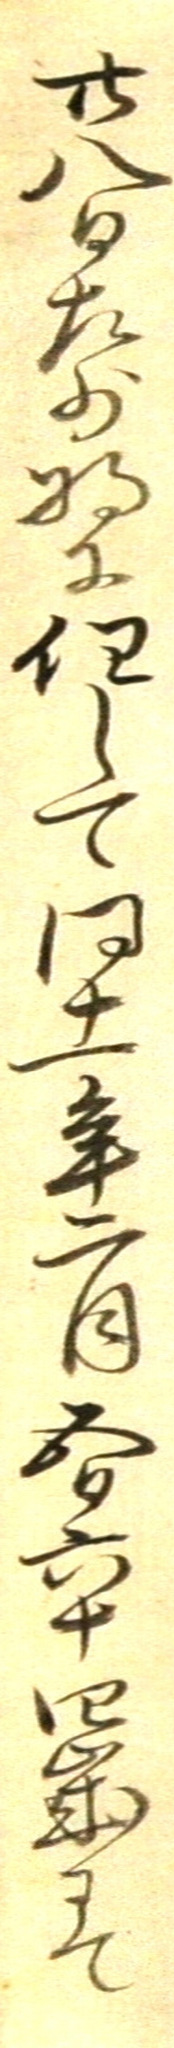廿八日左少将に任して同十一年二月五日六十四歳にて

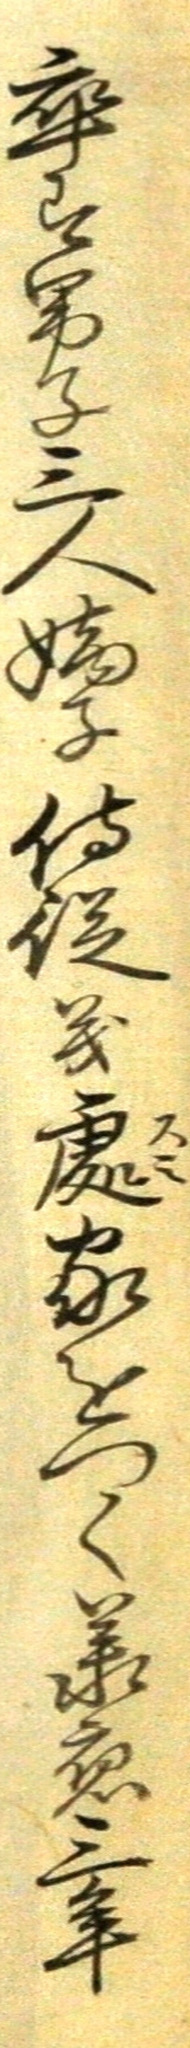卒す男子三人嫡子侍従義処家をつく承応三年
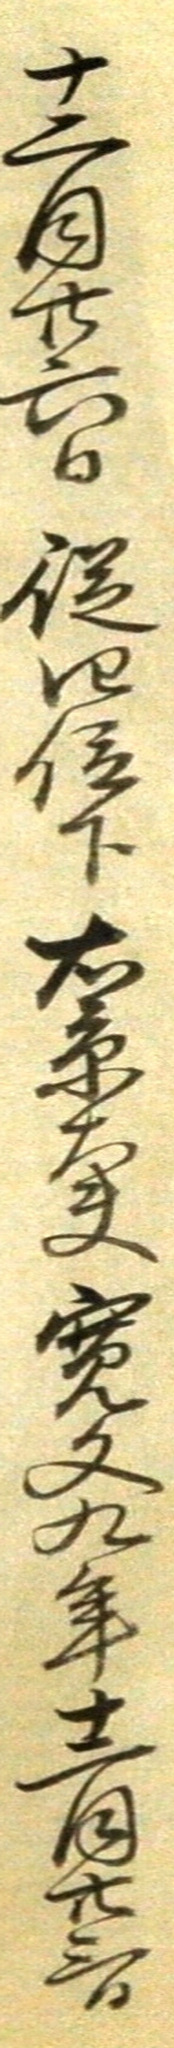十二月二十六日従四位下右京大夫寛文九年十二月廿三日
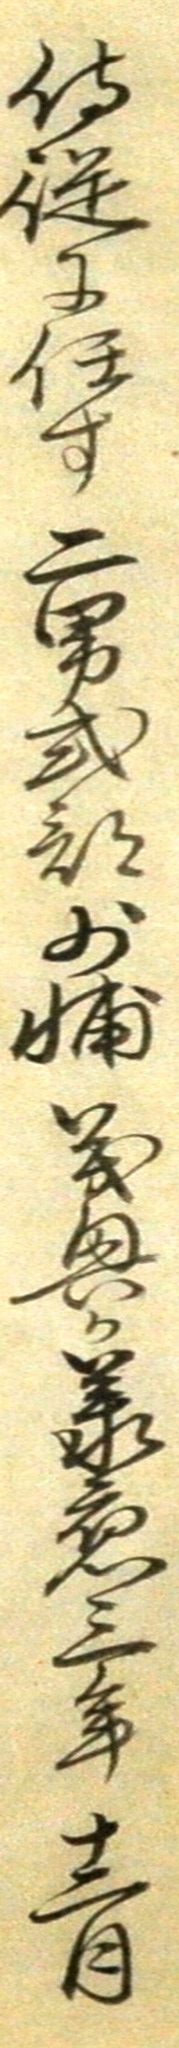侍従に任す二男式部少輔義興か承応三年十二月
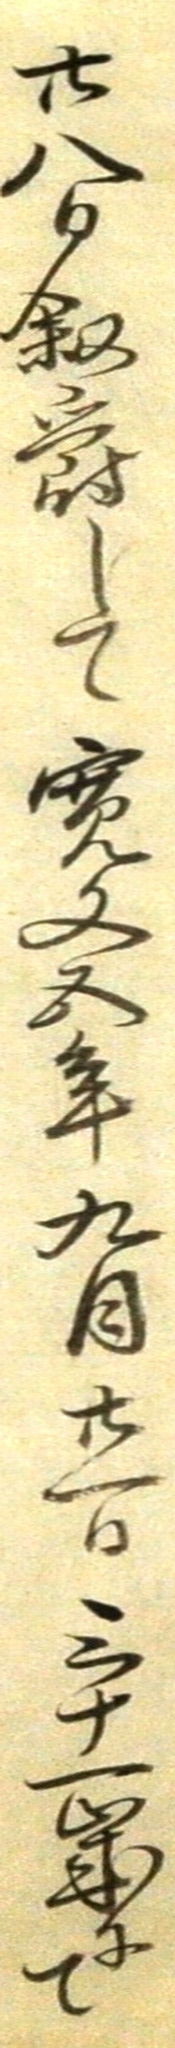廿八日叙爵して寛文五年九月廿一日三十一歳にて
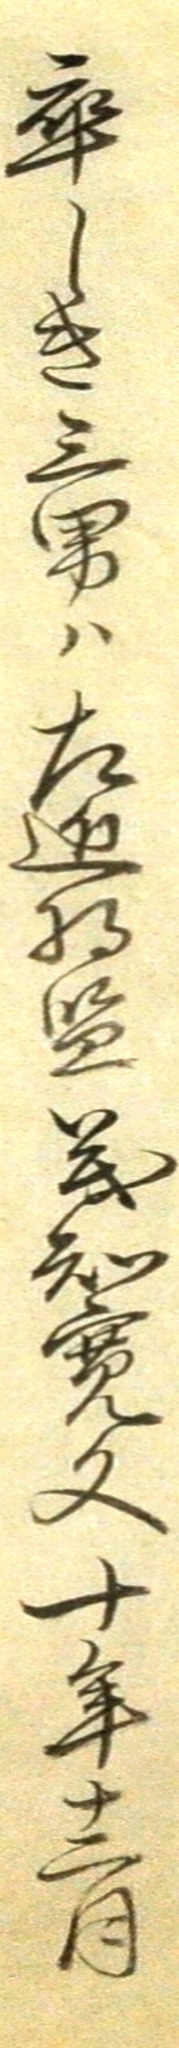卒しき三男は左近将監義知寛文十年十二月
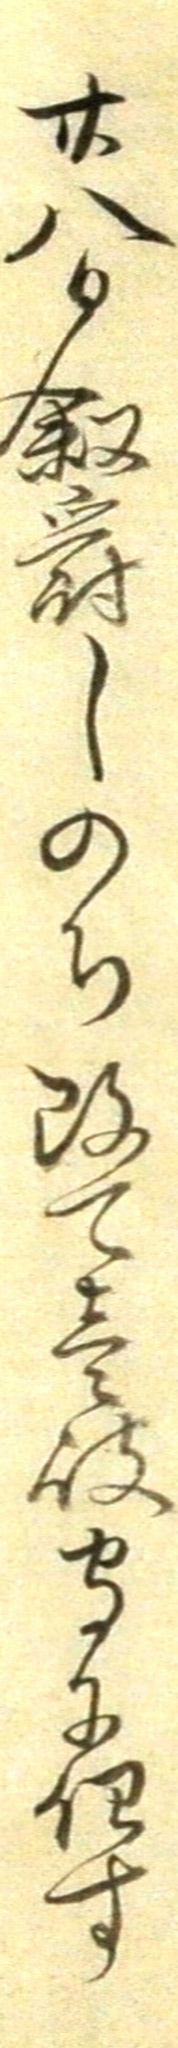廿八日叙爵しのち改て壱岐守に任す
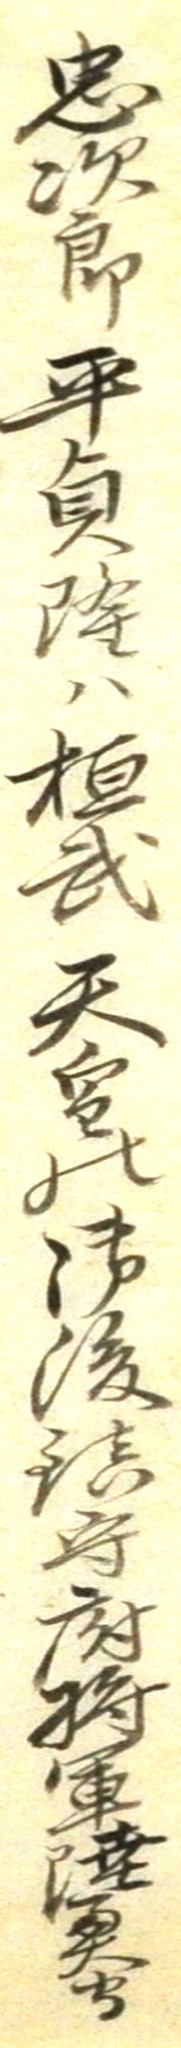忠次郎平貞隆は桓武天皇の御後鎮守府将軍陸奥守
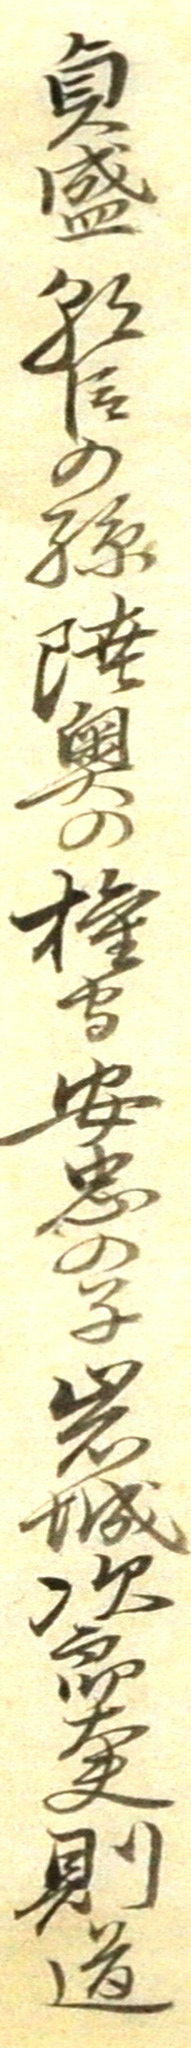貞盛朝臣の孫陸奥の権守安忠の子岩城次郎大夫則道
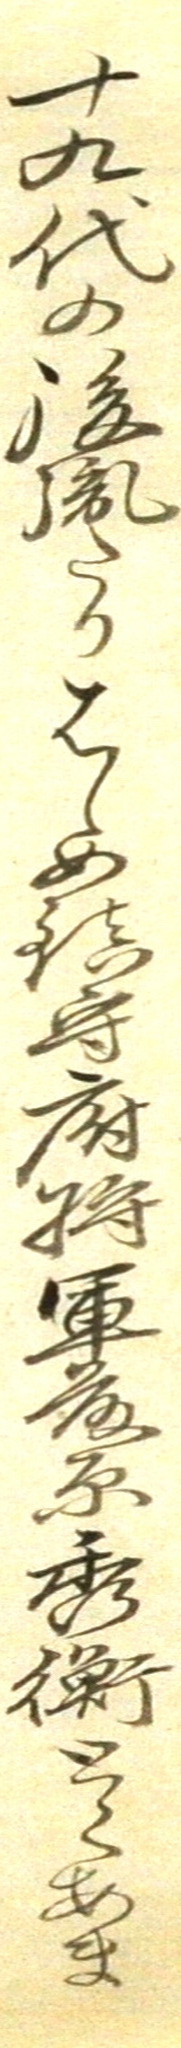十九代の後胤たりはしめ鎮守府将軍藤原秀衡とくあま
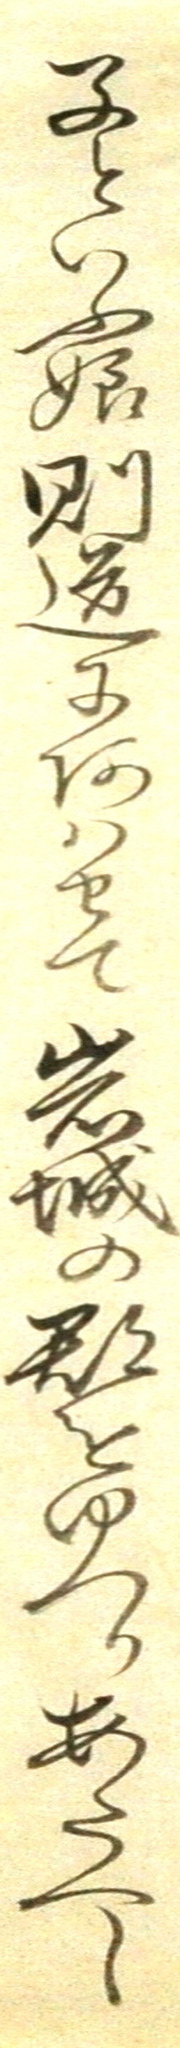子といふ娘則道にあはせて岩城の郡をゆつりあたへし
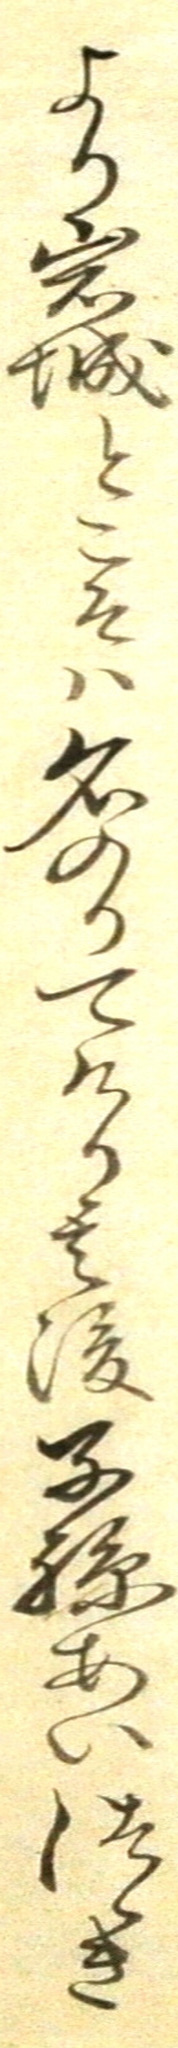より岩城とこそは名のりてけり其後子孫あいつゝき
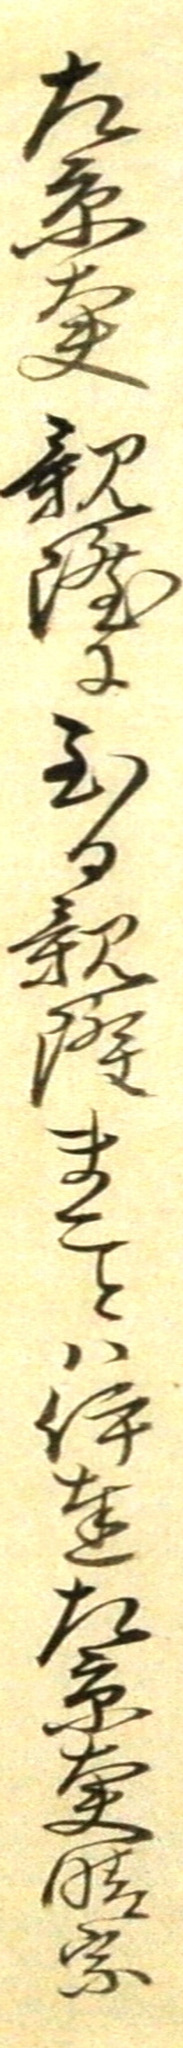左京大夫親隆に至る親隆まことは伊達左京大夫晴宗
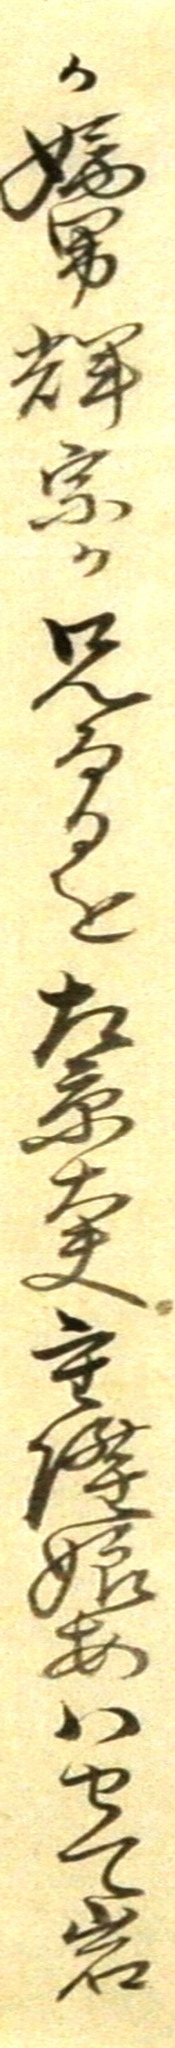か嫡男輝宗か兄なるを左京大夫重隆娘あはせて岩
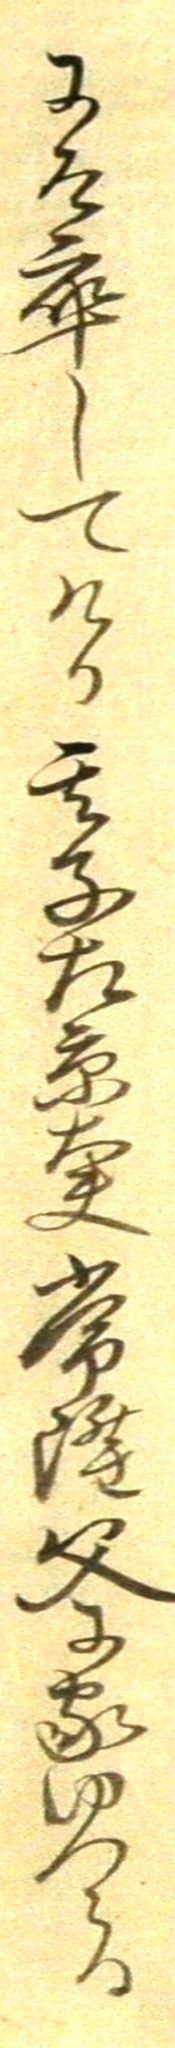にそ卒してけり其子左京大夫常隆父に家ゆつらる

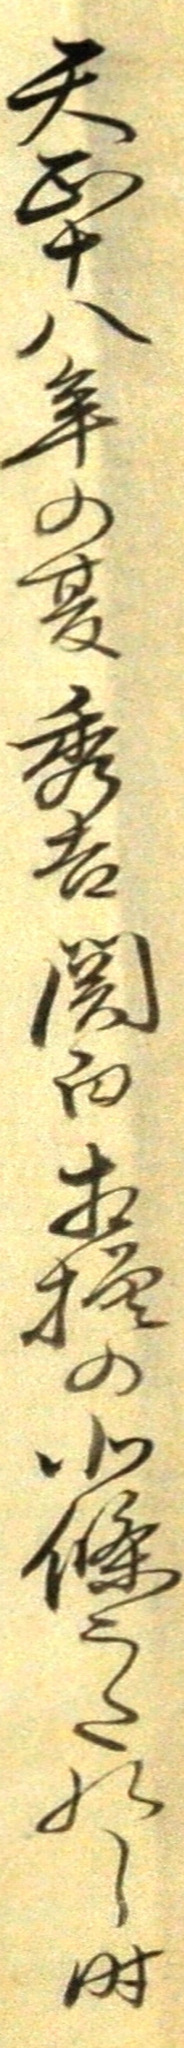天正十八年の夏秀吉関白相模の北条うたれし時
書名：藩翰譜（八・下）
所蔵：伊那市立高遠町図書館・合同会社AMANE
